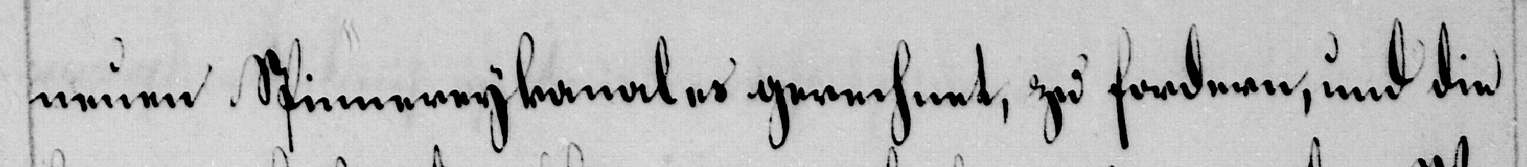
neuen Spinnereykanales gerechnet, zu fordern, und die
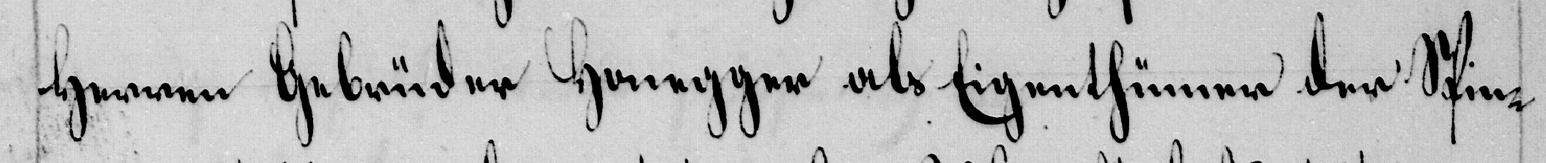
Herren Gebrüder Honegger als Eigenthümer der Spin¬
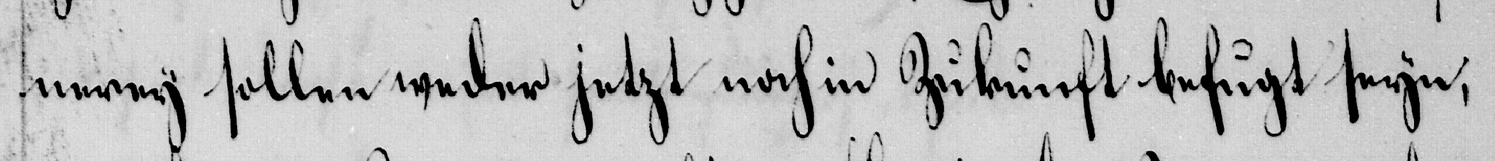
nerey sollen weder jetzt noch in Zukunft befugt seyn,
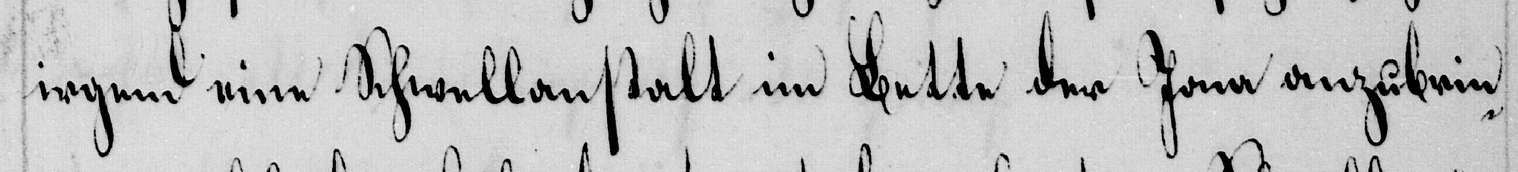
irgend eine Schwellanstalt im Bette der Jona anzubrin¬
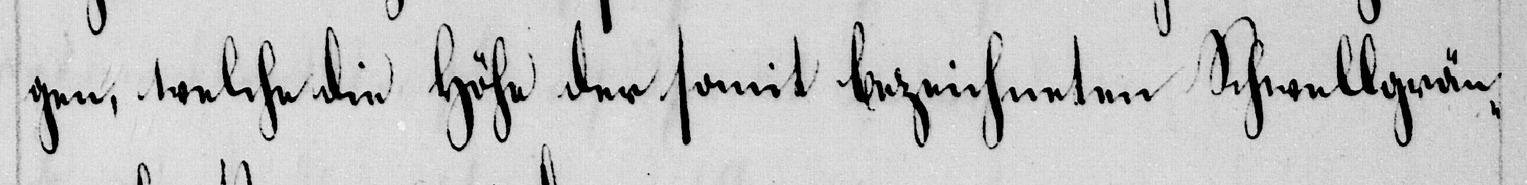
gen, welche die Höhe der somit bezeichneten Schwellgrän¬
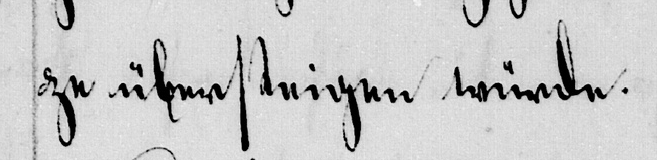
ze übersteigen würde.
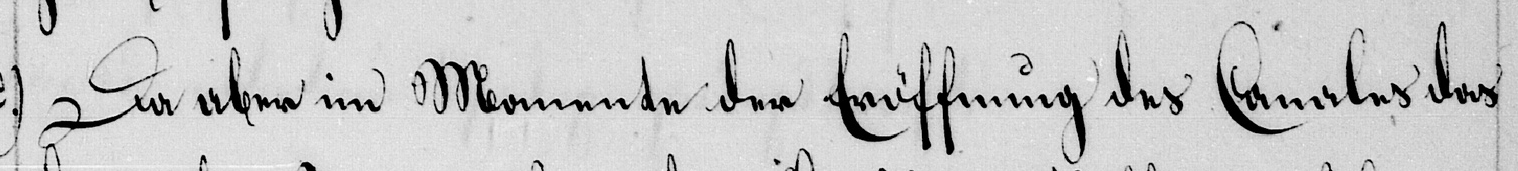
Da aber im Momente der Eröffnung des Canales das
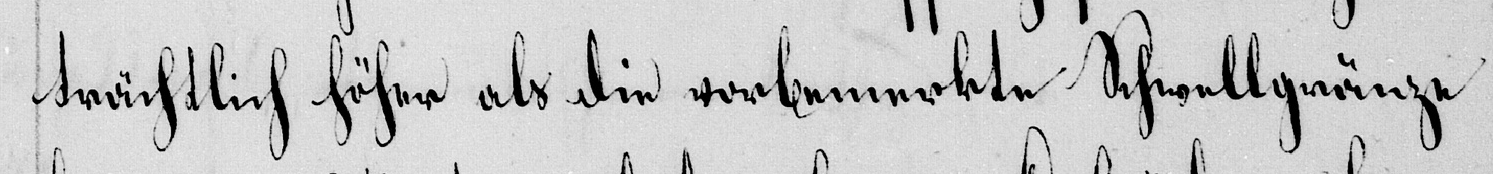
trächtlich höher als die vorbemerkte Schwellgränze
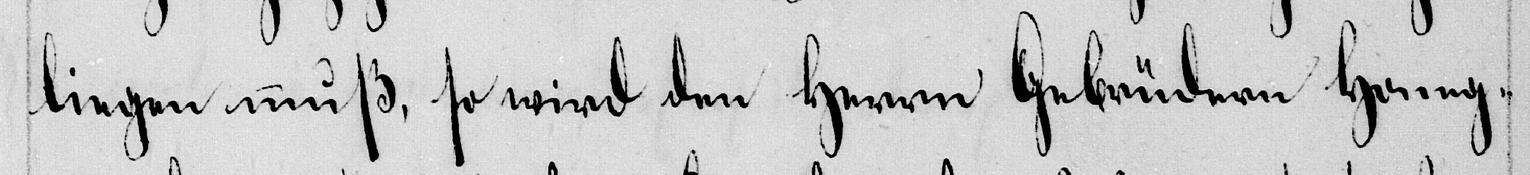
liegen muß, so wird den Herren Gebrüdern Honeg¬
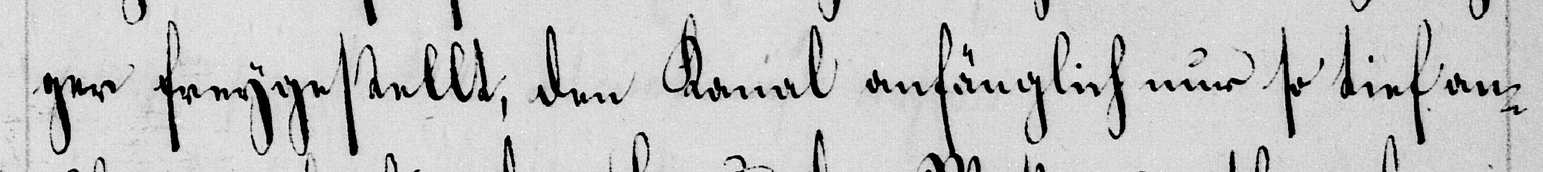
ger freygestellt, den Kanal anfänglich nur so tief an¬
